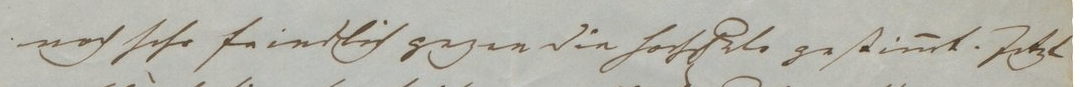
noch sehr feindlich gegen die Hochschule gestimmt. Jetzt
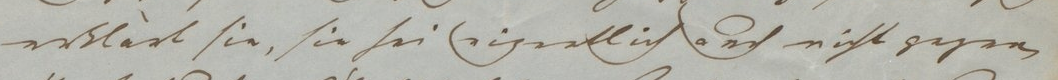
erklärt sie, sie sei eigentlich auch nicht gegen
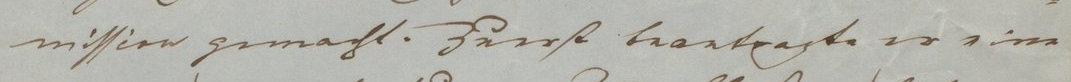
mission gemacht. Zuerst beantragte er eine
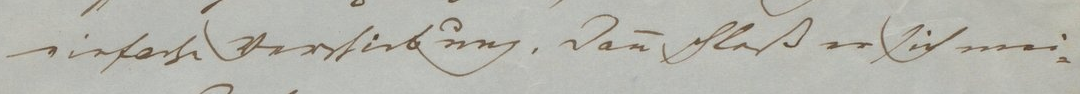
einfache Verschiebung. Dann schloß er sich mei-
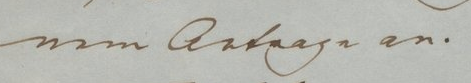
nem Antrage an.
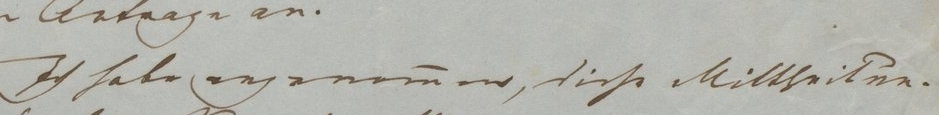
Ich habe angenommen, diese Mittheilun-
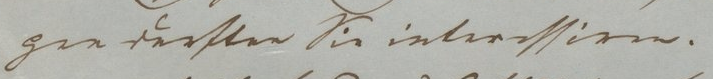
gen dürften Sie interessiren.
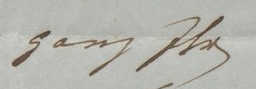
ganz Ihr
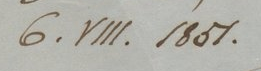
6. VIII. 1851.
